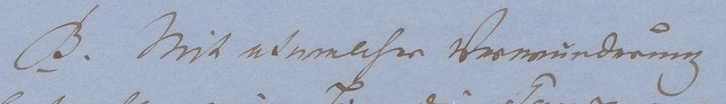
B. Mit etwelcher Verwunderung
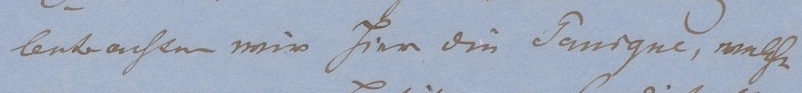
betrachten wir hier die Panique, welche
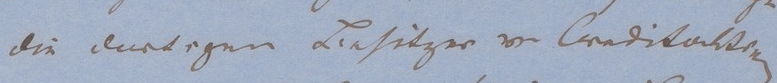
die dortigen Besitzer von Creditaktien
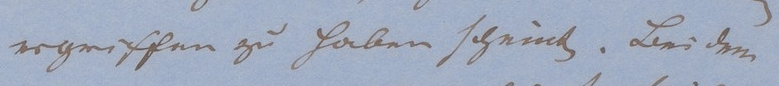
ergriffen zu haben scheint. Bei dem
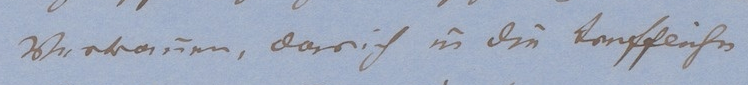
Vertrauen, das ich in die treffliche
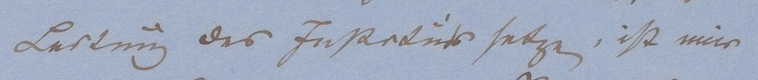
Leitung des Institut's setze, ist mir
